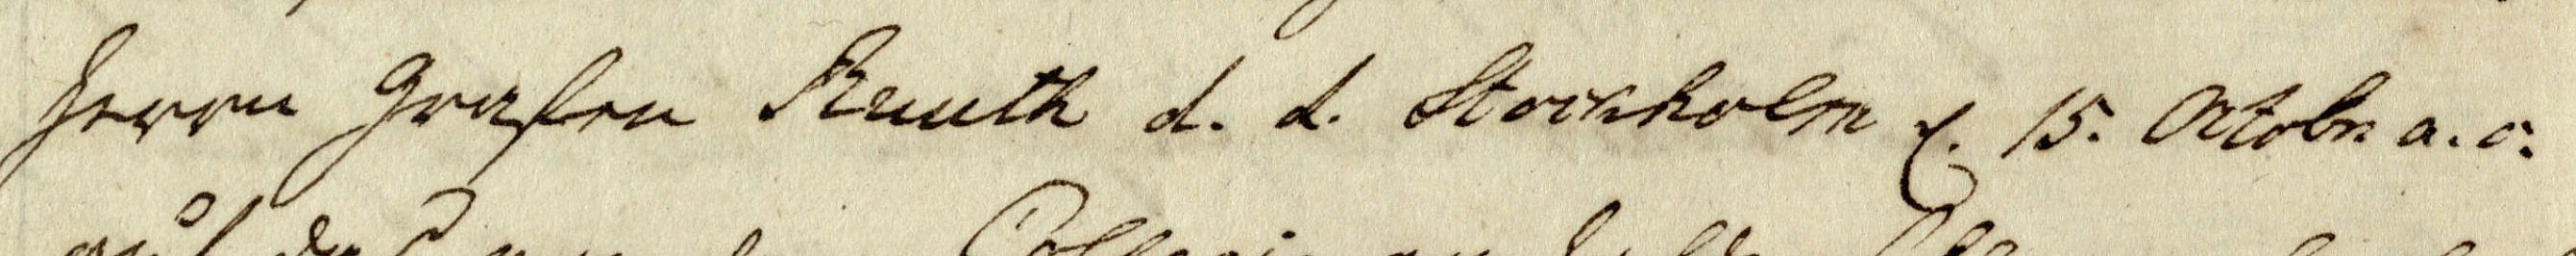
Herrn Grafen Ruuth d. d. Stockholm l. 15. Octobr. a. c.
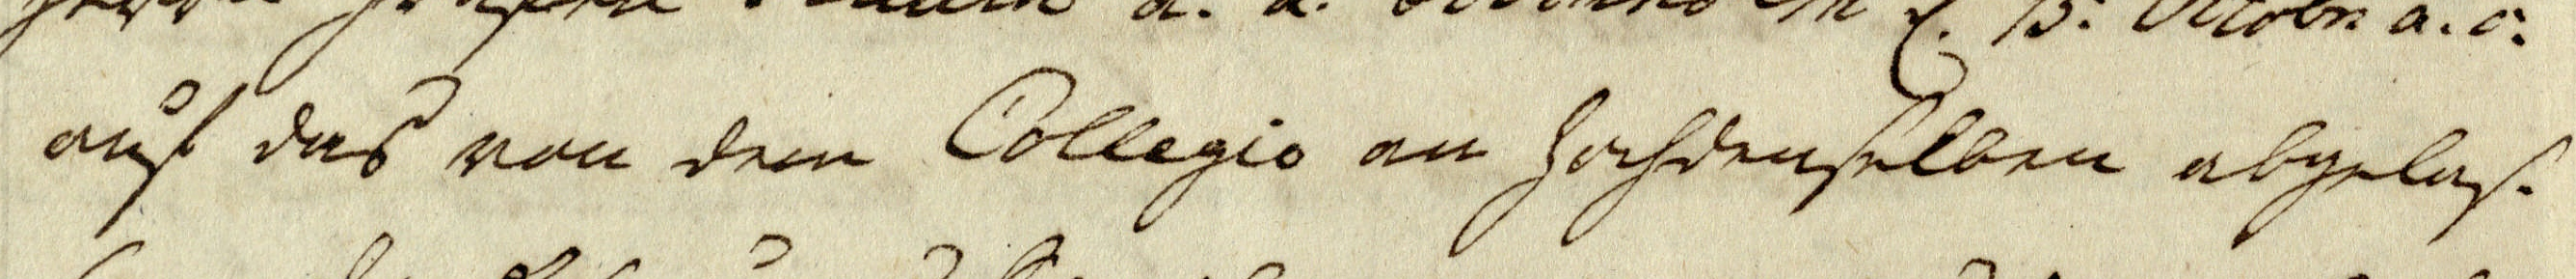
auf das von dem Collegio an Hochdenselben abgelas¬
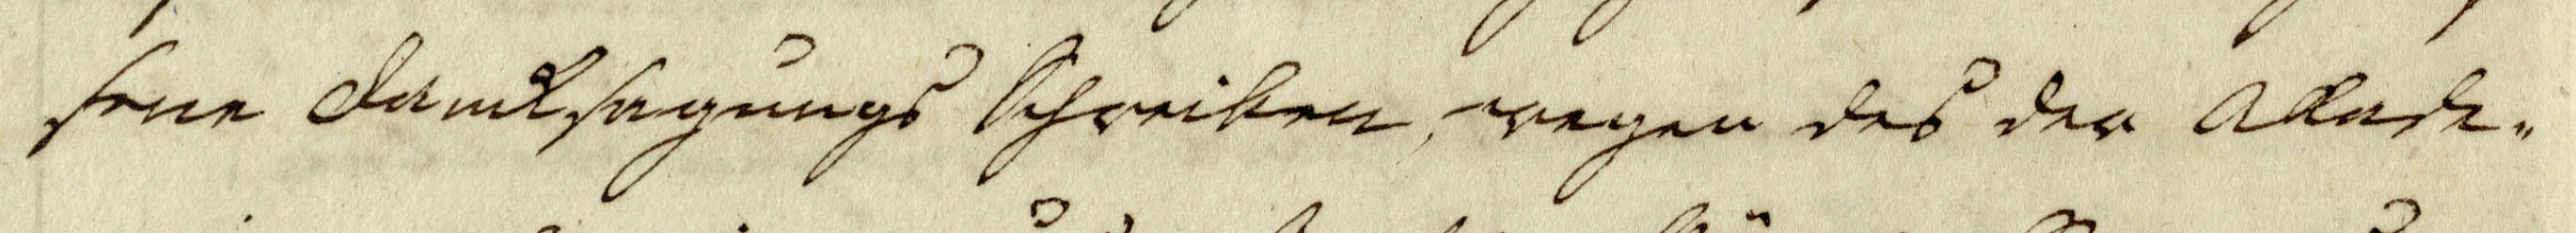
sene Dancksagungs Schreiben wegen des der Akade¬
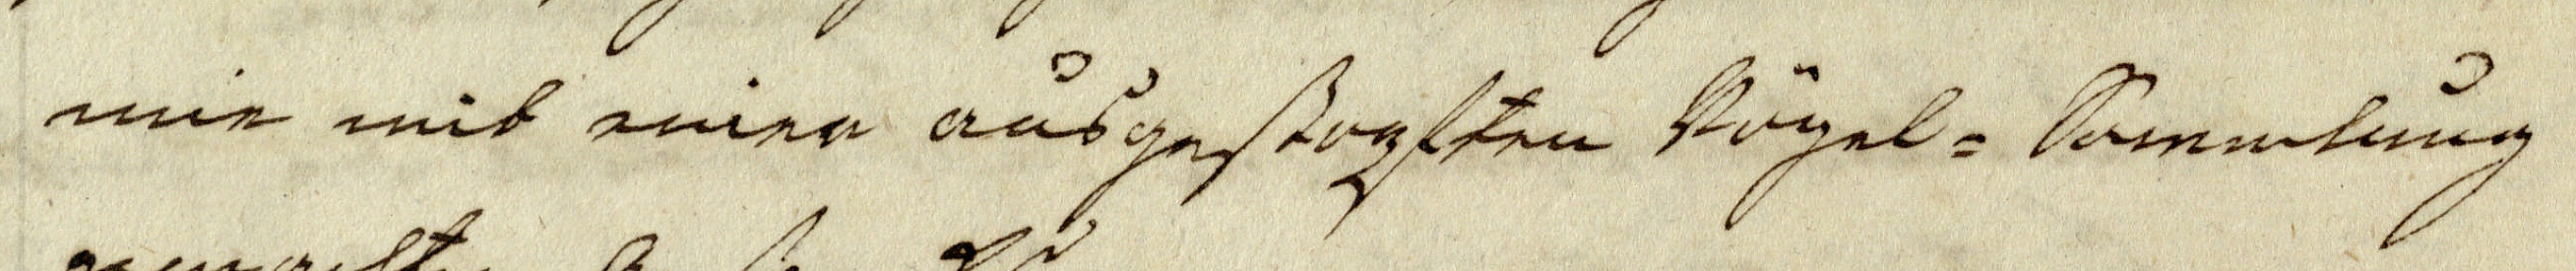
mie mit einer ausgestopften Vögel-Sammlung
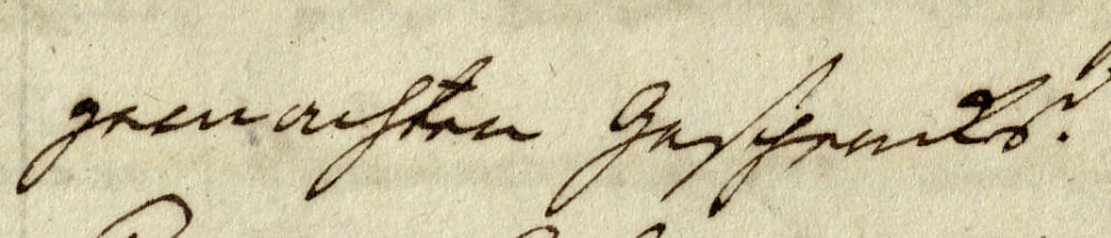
gemachten Geschencks.
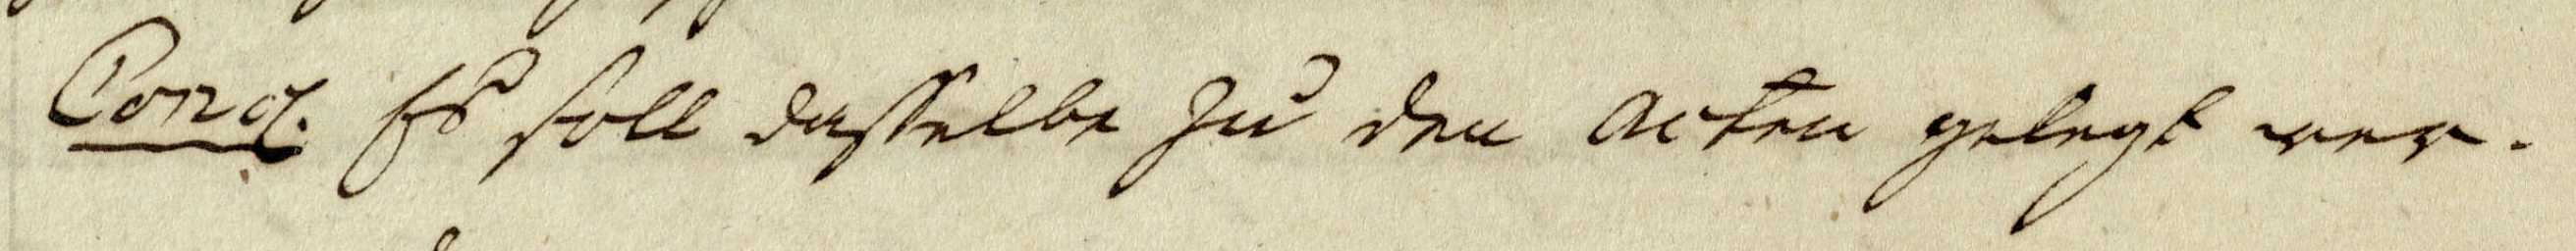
Concl. Es soll dasselbe zu den Acten gelegt wer¬
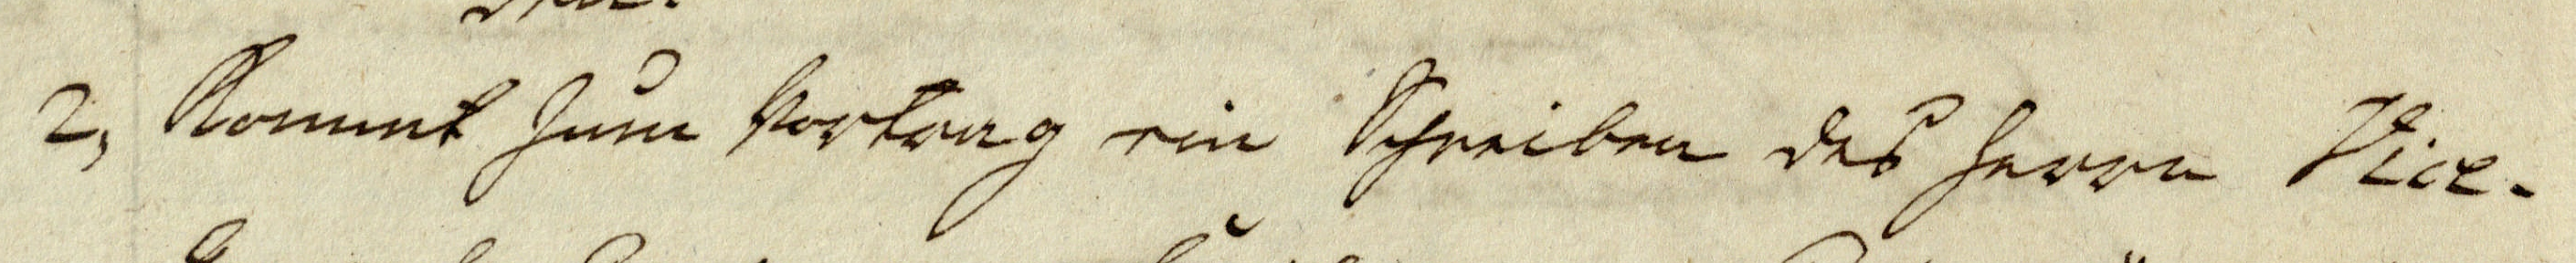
2, Kommt zum Vortrag ein Schreiben des Herrn Vice¬
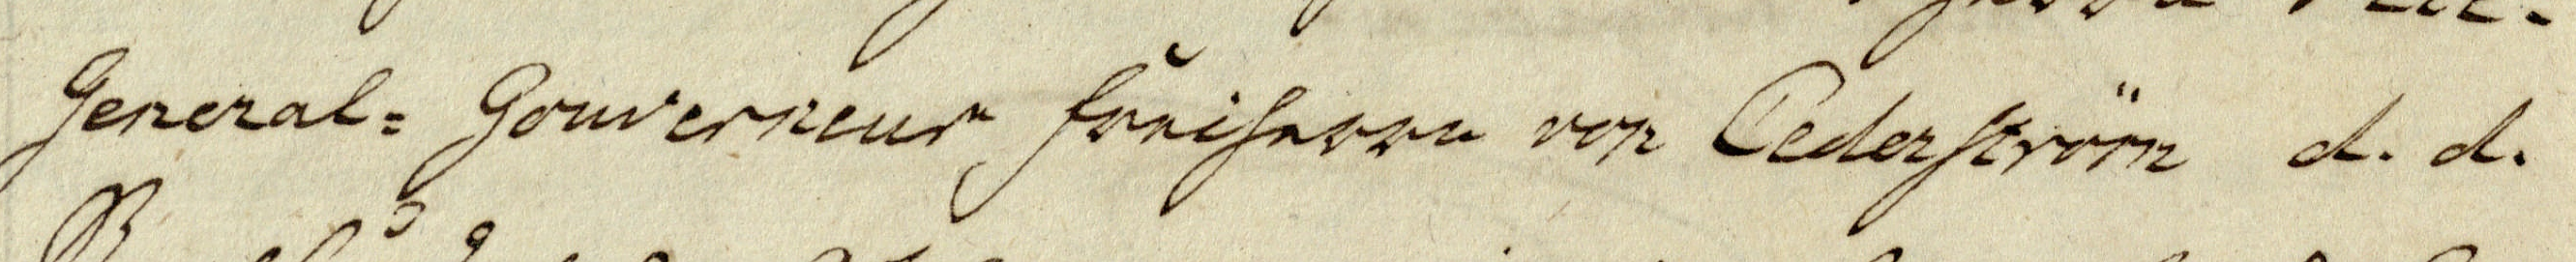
General- Gouverneurs Freiherrn von Cederström d. d.
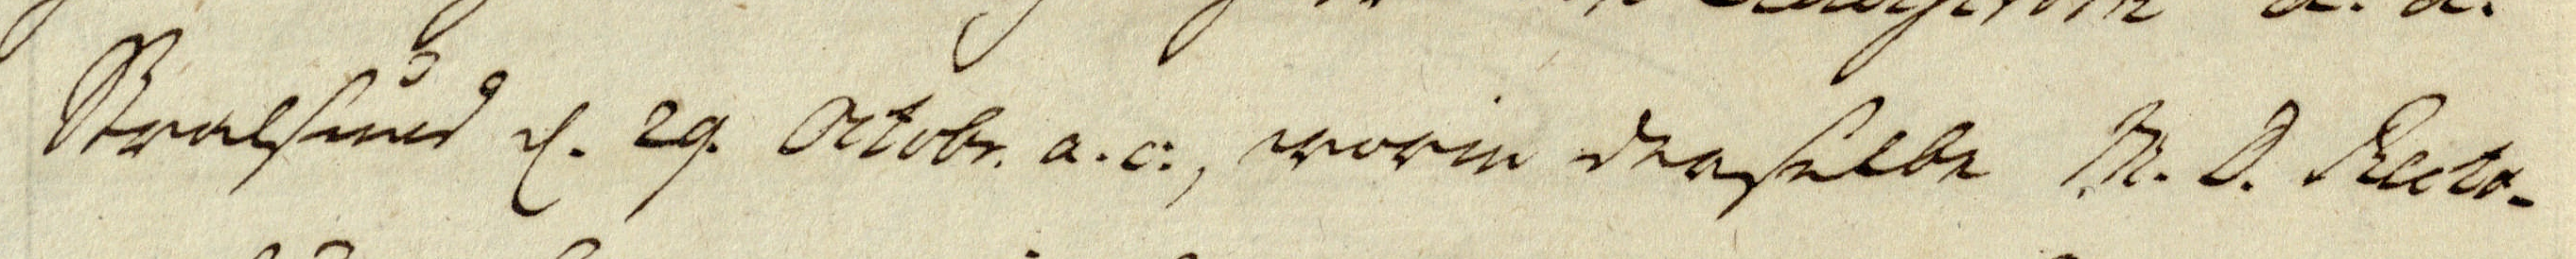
Stralsund d. 29. Octobr. a. c., worin derselbe M. D. Recto¬
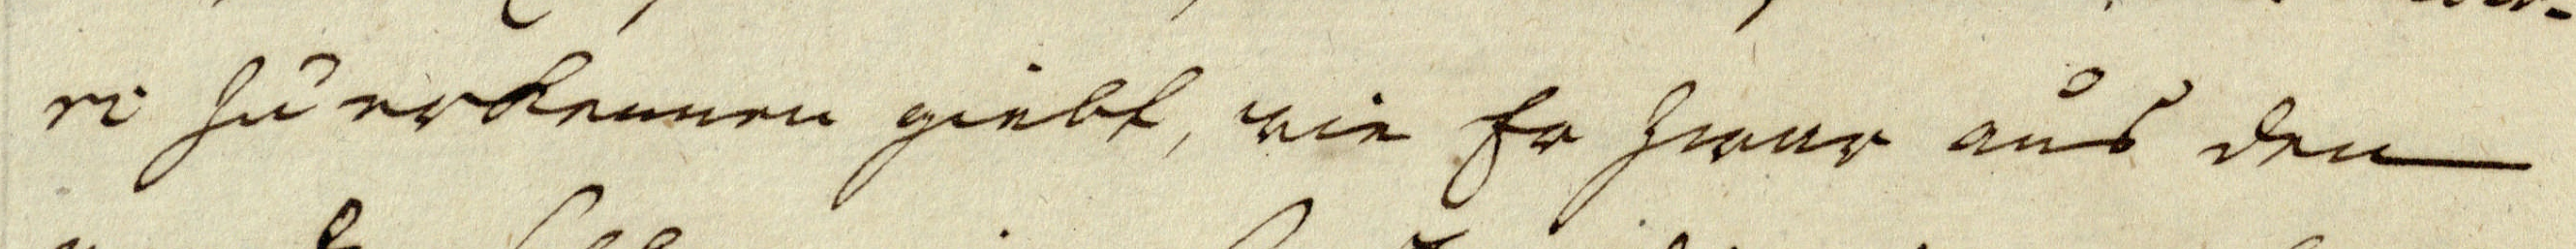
ri zu erkennen giebt, wie Er zwar aus den
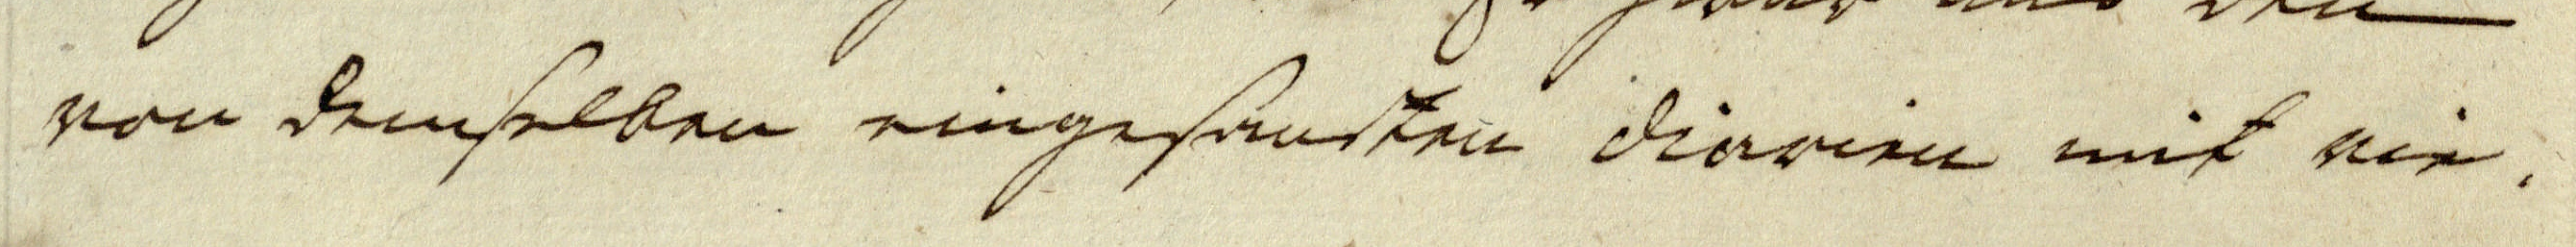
von demselben eingesandten Diarien mit vie¬
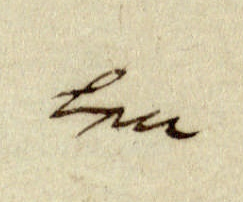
len
